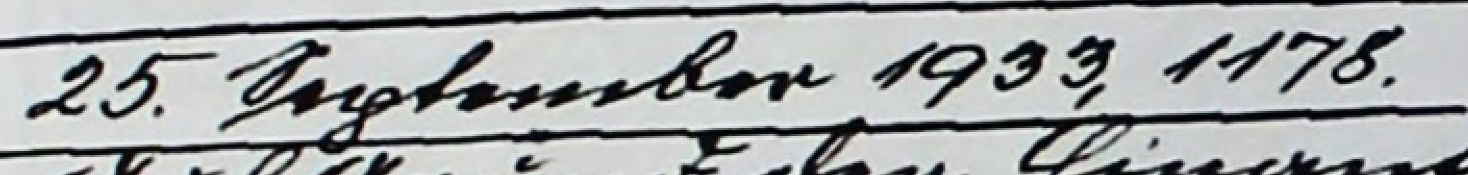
25. September 1933, 1178.
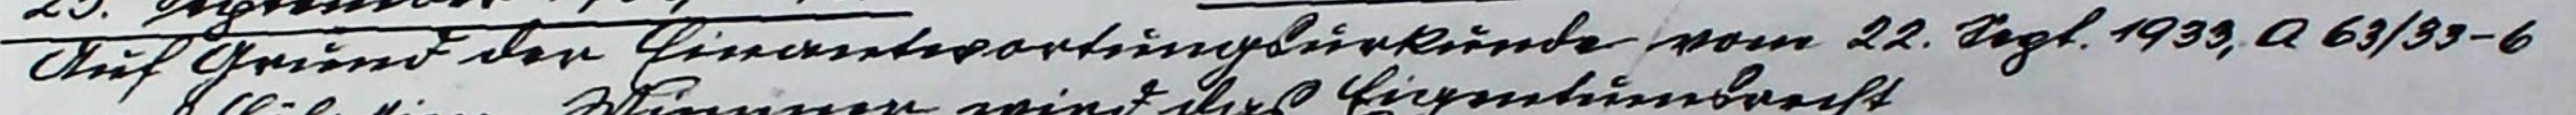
Auf Grund der Einantwortungsurkunde vom 22. Sept. 1933, A 63/33-6
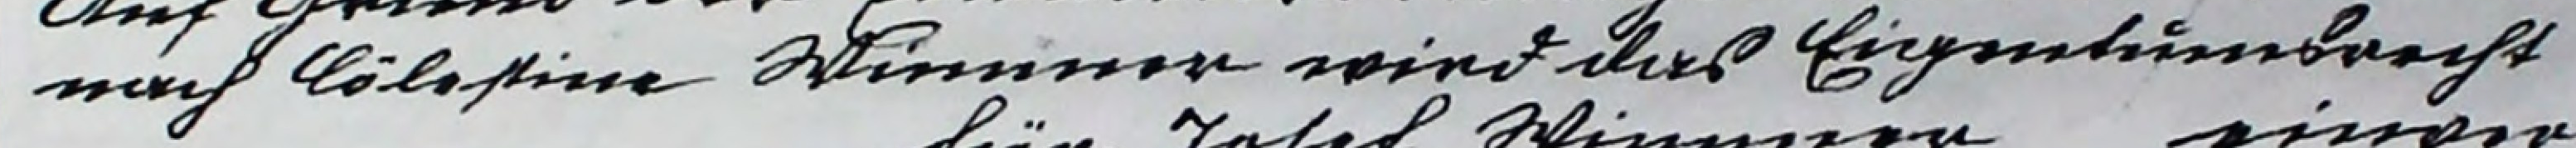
nach Cölestine Wimmer wird das Eigentumsrecht
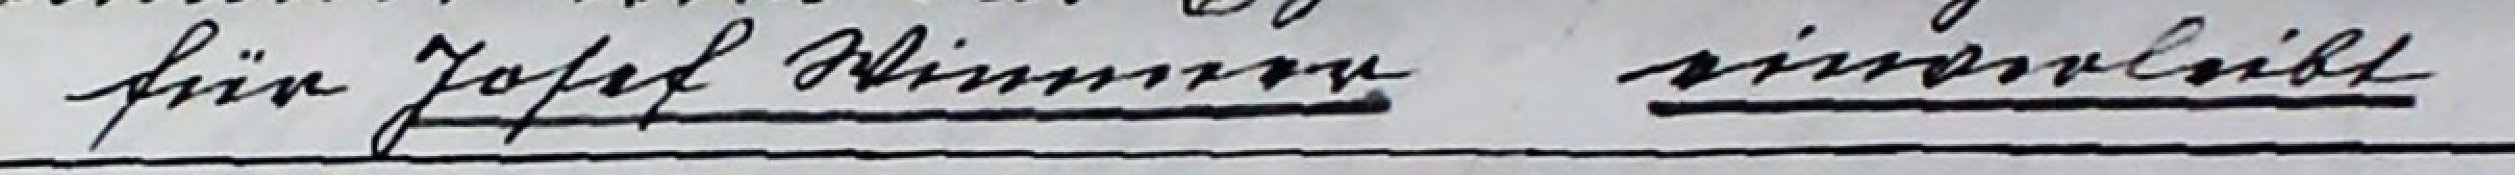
für Josef Wimmer einverleibt
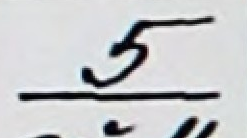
5
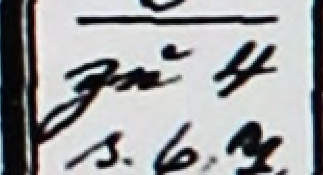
zu 4
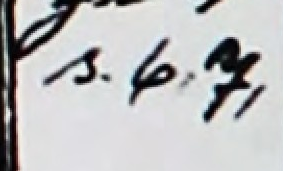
s. 6, 7
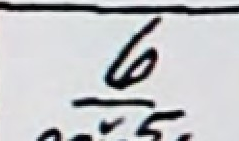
6
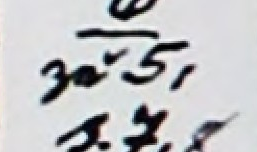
zu 5,
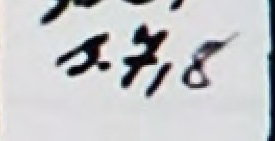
s. 7, 8
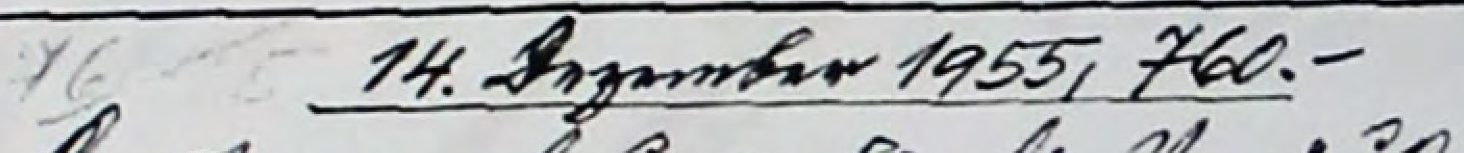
760/55 14. Dezember 1955, 760.-
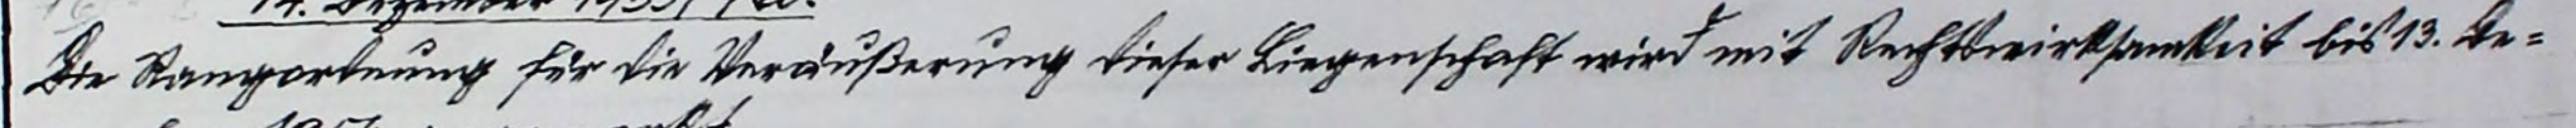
Die Rangerdung für die Veräußerung dieser Liegenschaft wird mit Rechtswirksamkeit bis 13. De=
